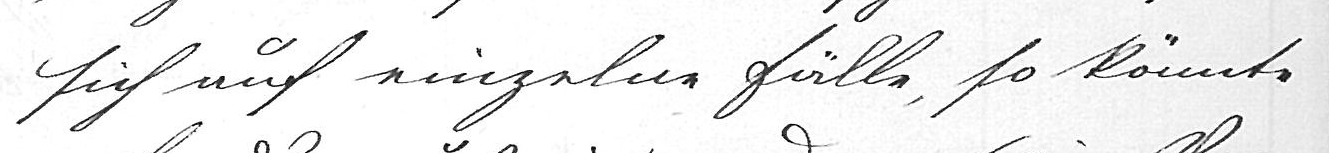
sich auf einzelne Fälle, so könnte
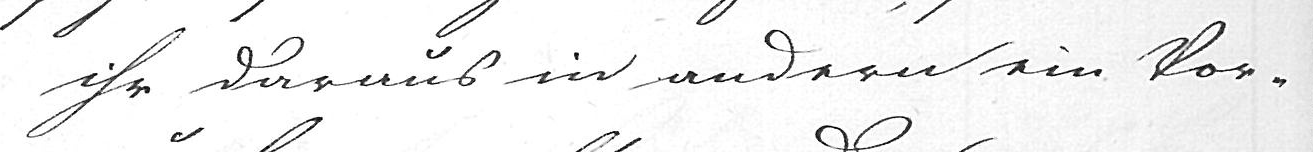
ihr daraus in andern ein Vor-
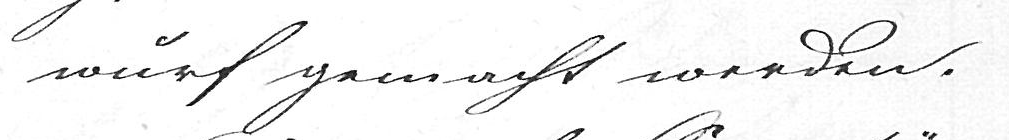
wurf gemacht werden.
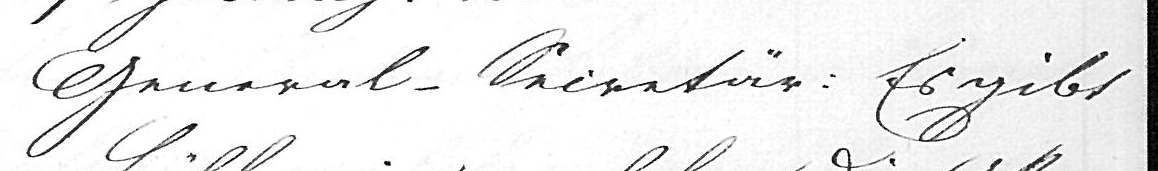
General-Secretär: Es gibt
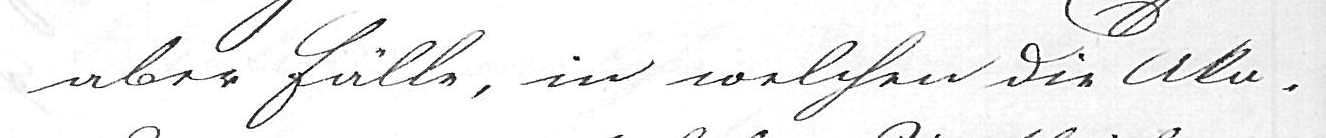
aber Fälle, in welchen die Aka-
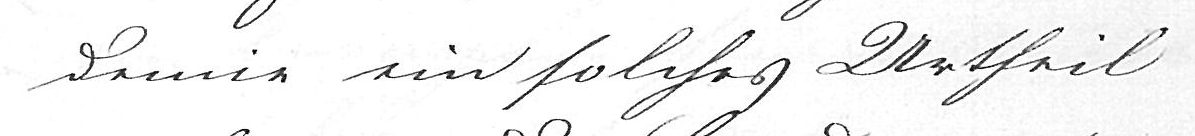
demie ein solches Urtheil
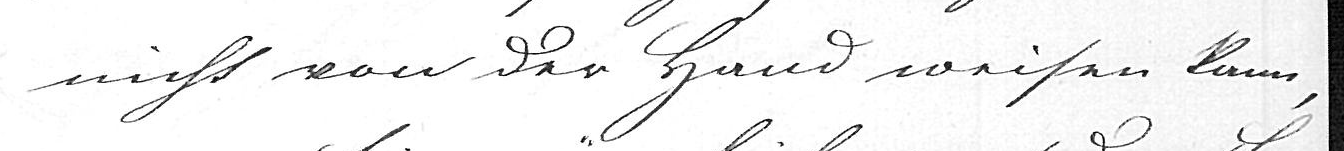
nicht von der Hand weisen kann,
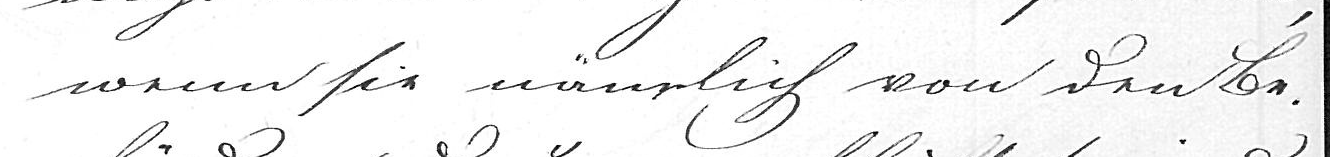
wenn sie nämlich von den Be-
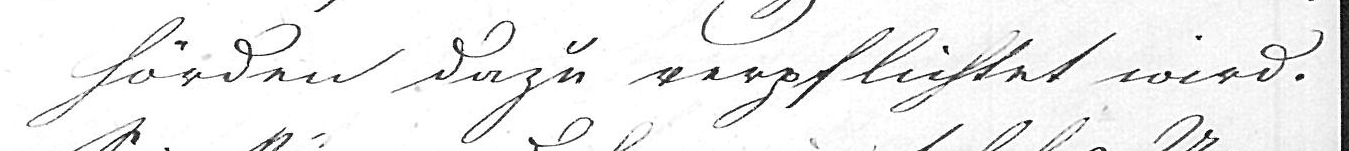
hörden dazu verpflichtet wird.
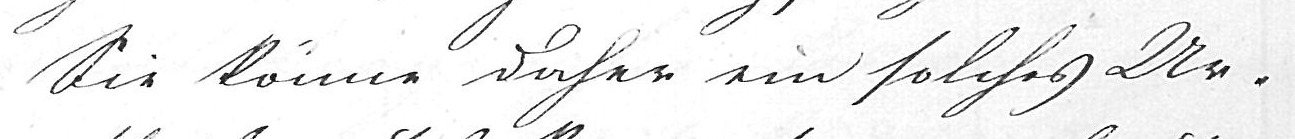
Sie könne daher ein solches Ur-
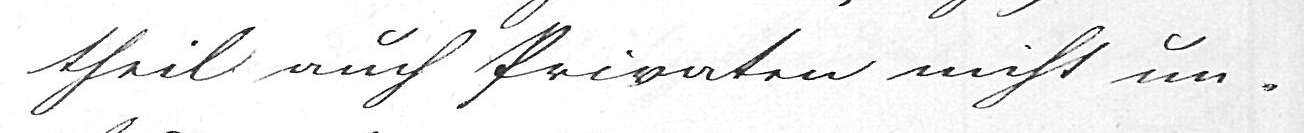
theil auch Privaten nicht un-
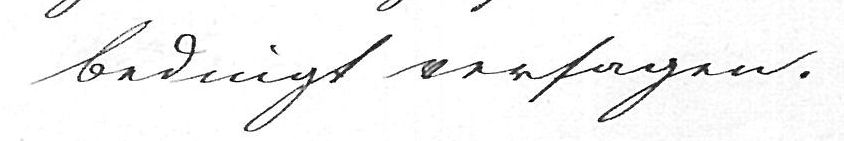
bedingt versagen.
